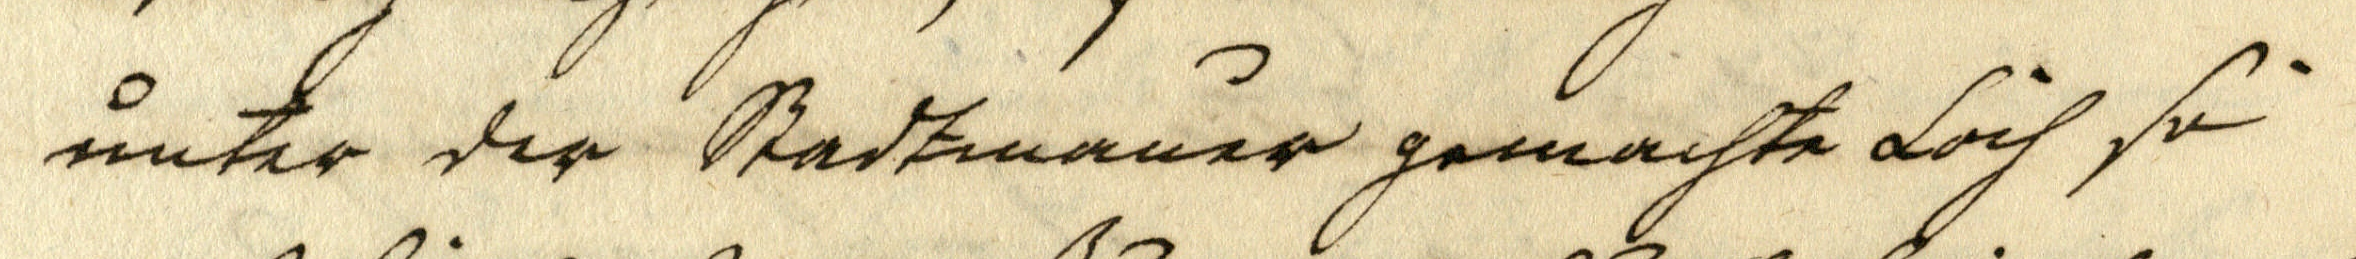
unter der Stadtmauer gemachte Loch so
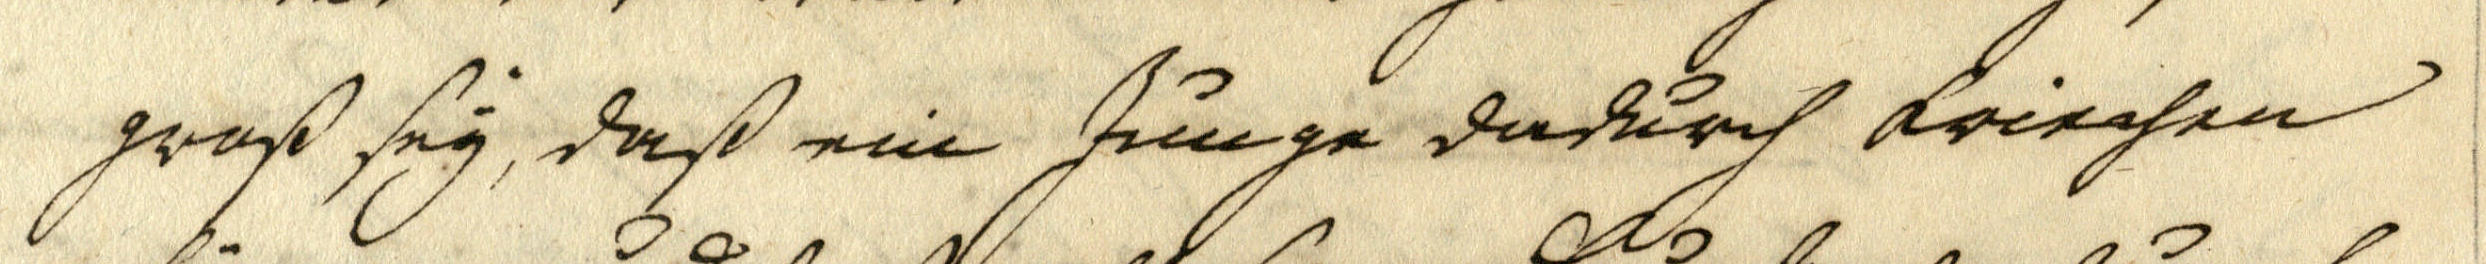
groß sey, daß ein Junge dadurch kriechen
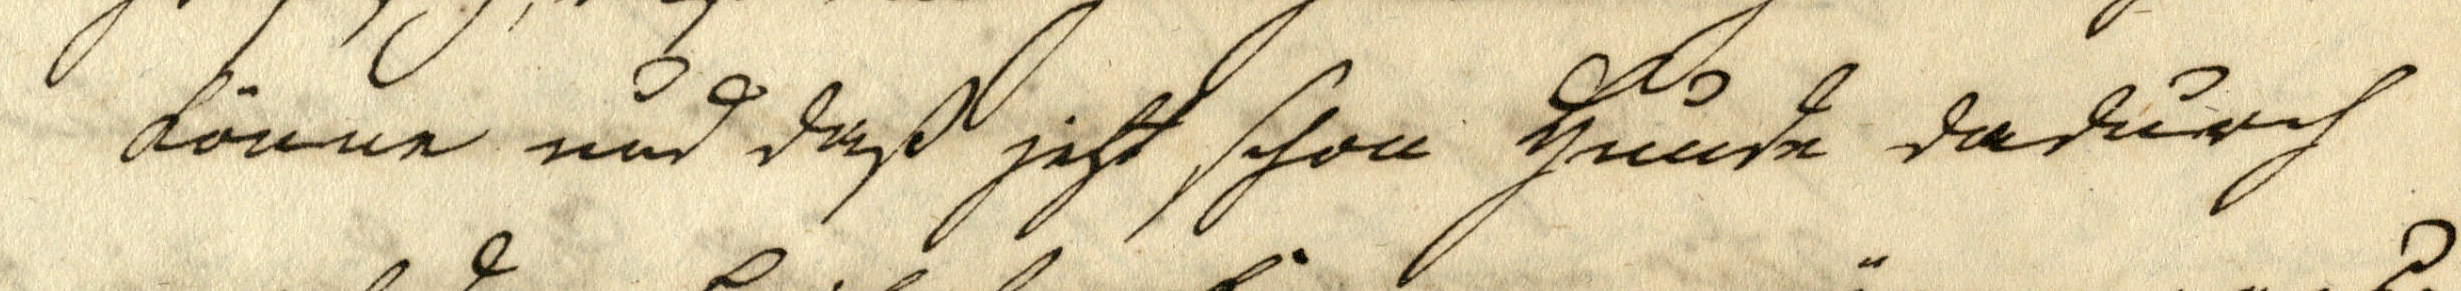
könne und daß jetzt schon Hunde dadurch
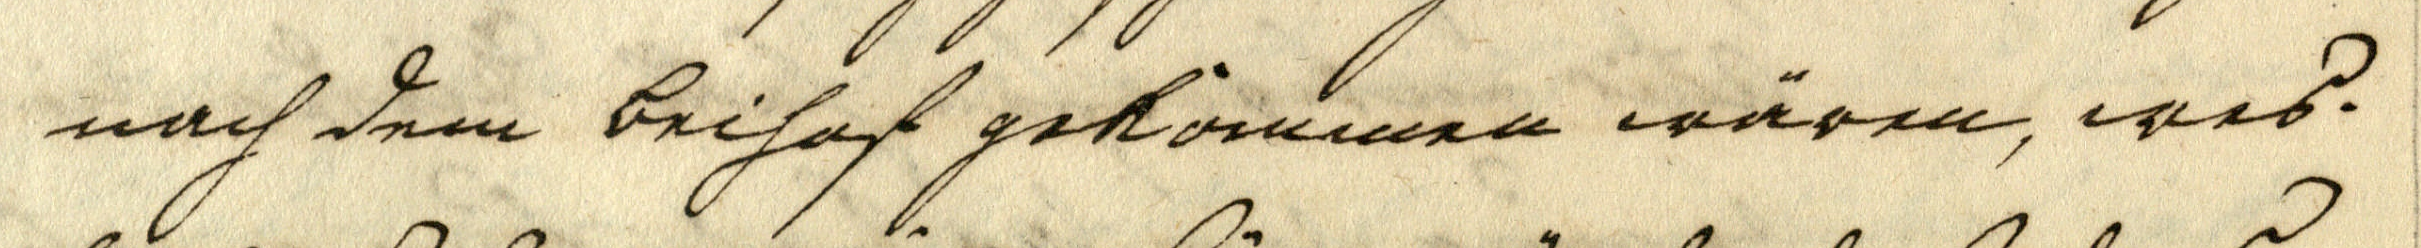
nach dem Beihof gekommen wären, wes-
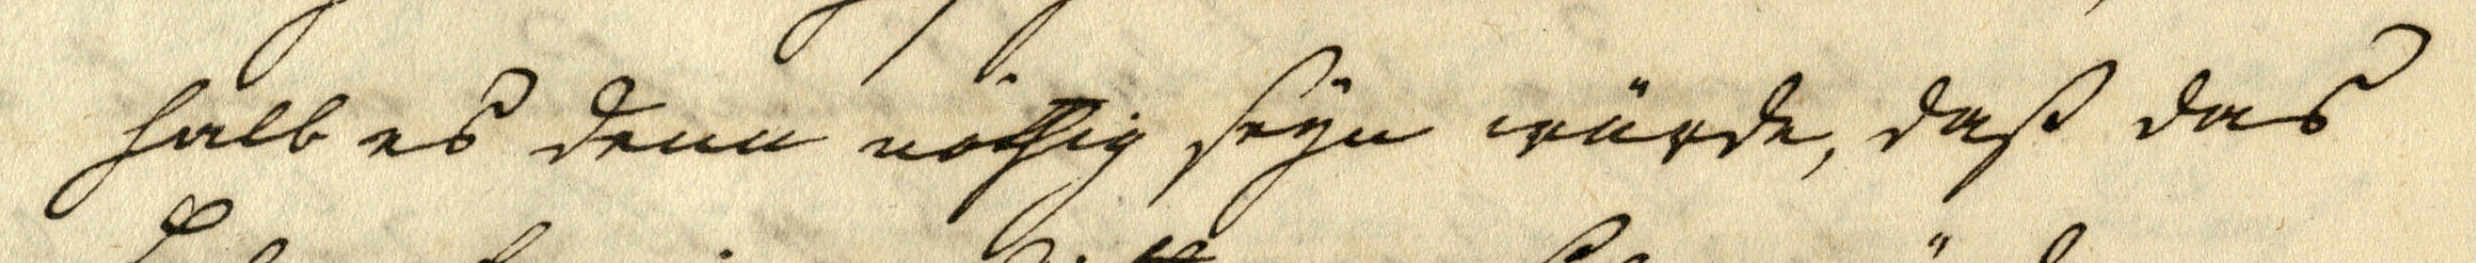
halb es denn nöthig seyn würde, daß das
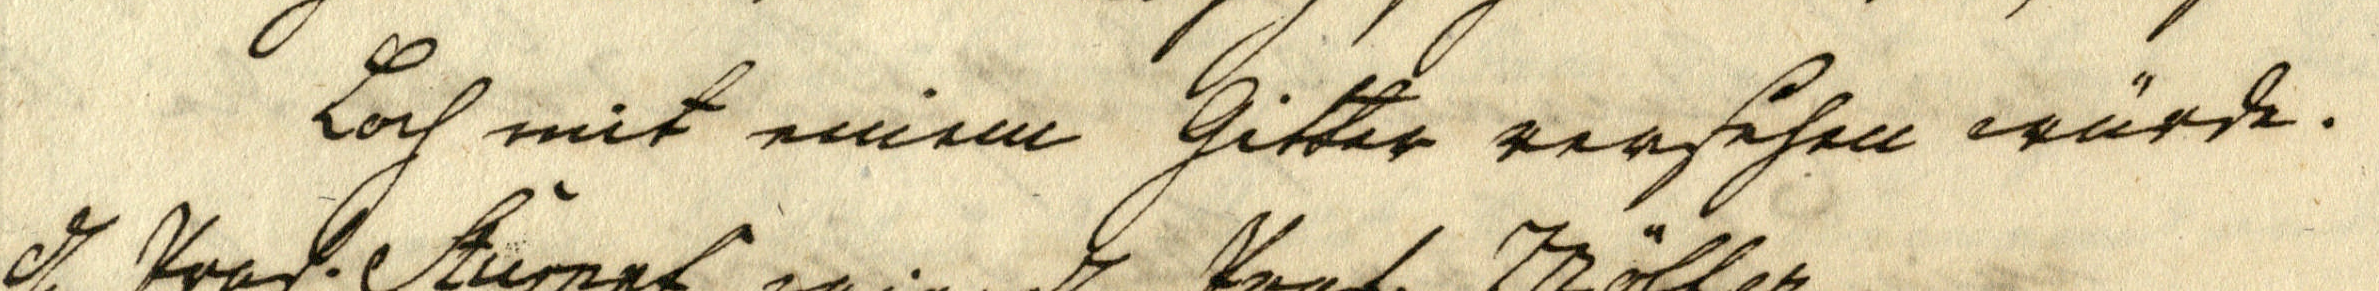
Loch mit einem Gitter versehen würde.
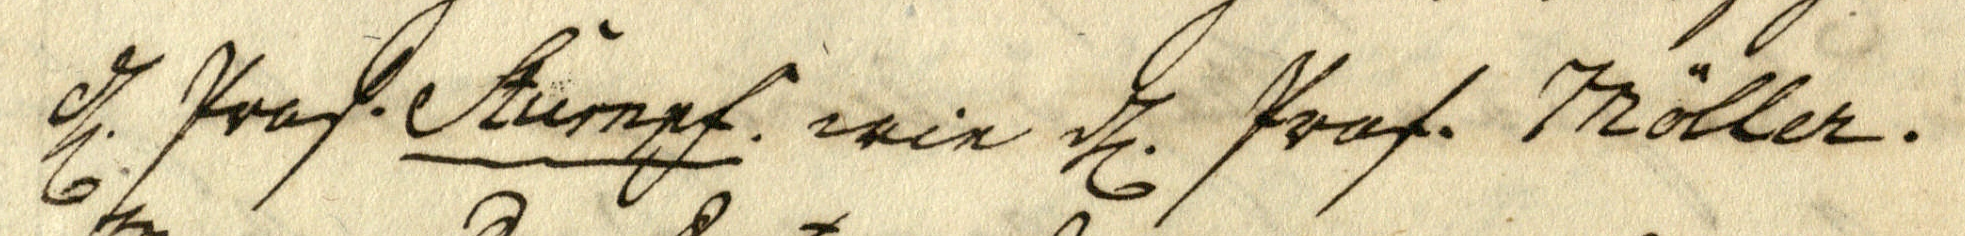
dh. Prof. Stumpf. wie dh. Prof. Möller.
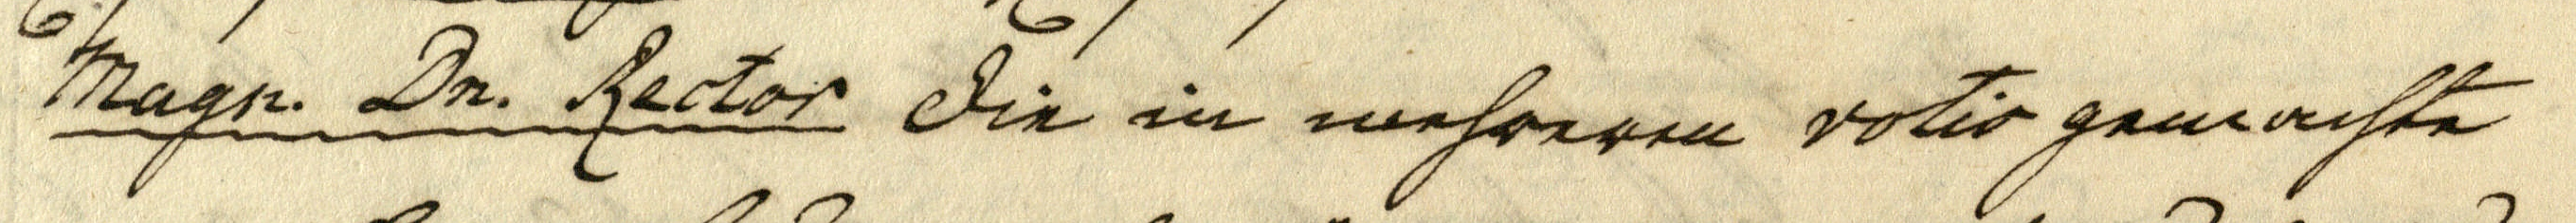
Magn. Dn. Rector die in mehreren votis gemachte
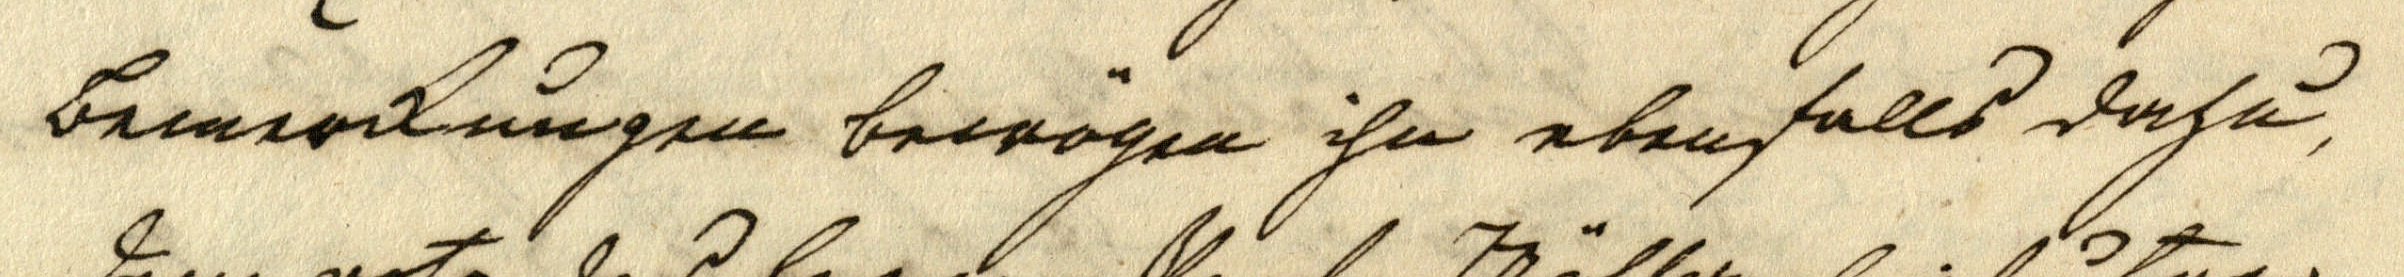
Bemerkungen bewögen ihn ebenfalls dazu,
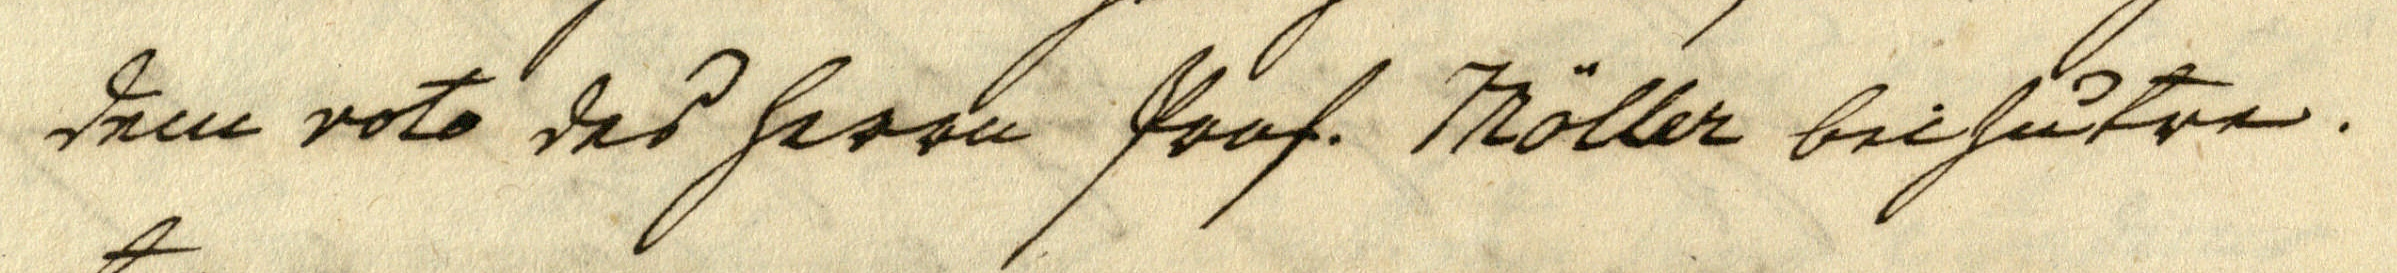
dem voto des herrn Prof. Möller beizutre-
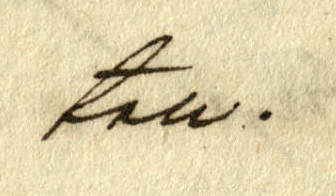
ten
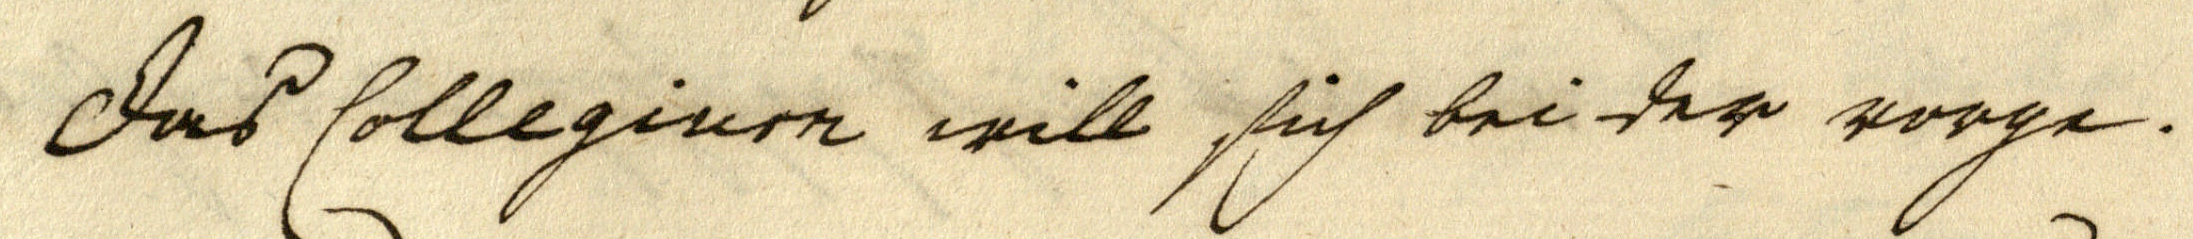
Das Collegium will sich bei der vorge
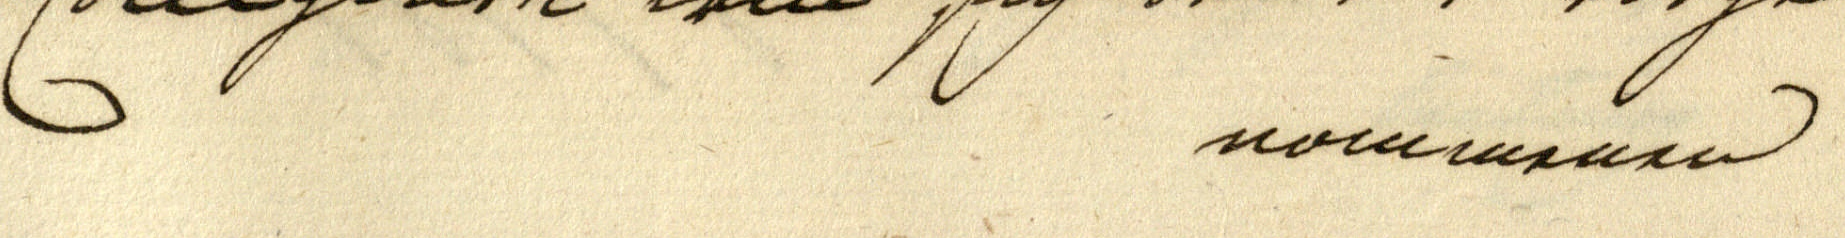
nommenen
